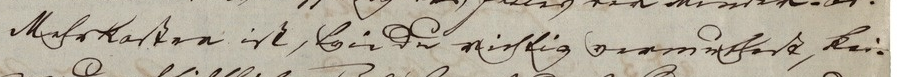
Mehrkarten ist, wie Du richtig vermuthest, kei-
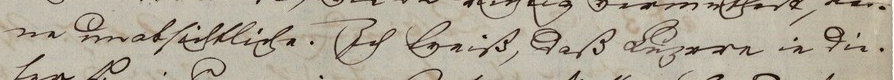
ne unabsichtliche. Ich weiß, daß Luzern in die-
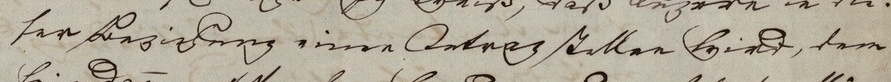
ser Beziehung einen Antrag stellen wird, dem
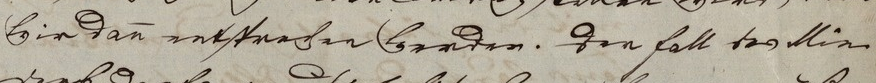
wir dann entsprechen werden. Der Fall des Min-
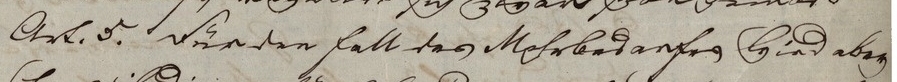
Art. 5. Für den Fall des Mehrbedarfs wird aber
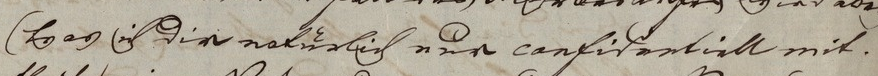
(was ich dir natürlich nur confidentiell mit-
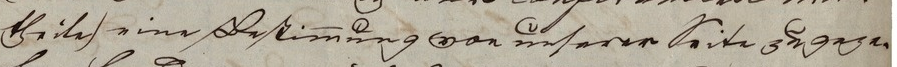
theile) eine Bestimmung von unserer Seite zugege-
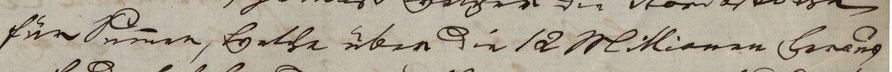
für Summen, welche über die 12 Millionen heraus
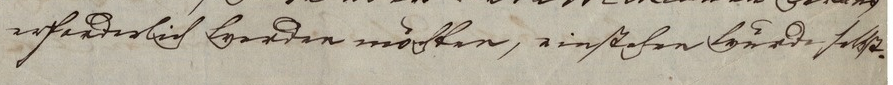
erforderlich werden möchten, einstehen würde selbst-
